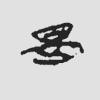是
